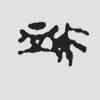{血夨}
